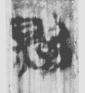則
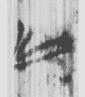亡
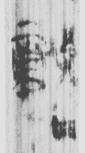{帝戈}
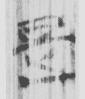是
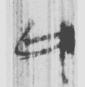㠯（以）
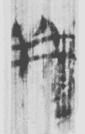并
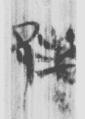邦
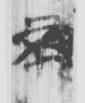不
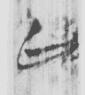㠯（以）
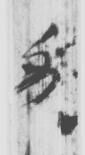力
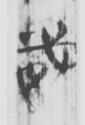威
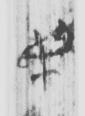民
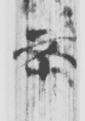不
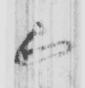㠯（以）
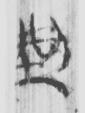型
